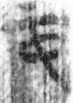𠁩
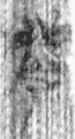○（藏）
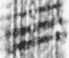三
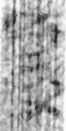箄
